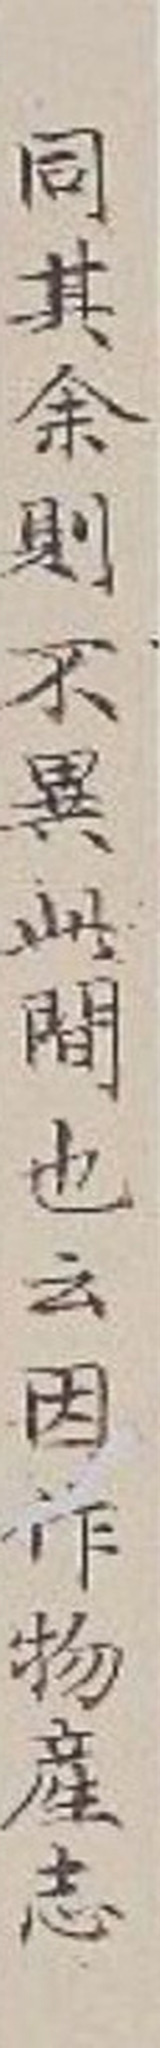同其余則不異此間也云因作物産志
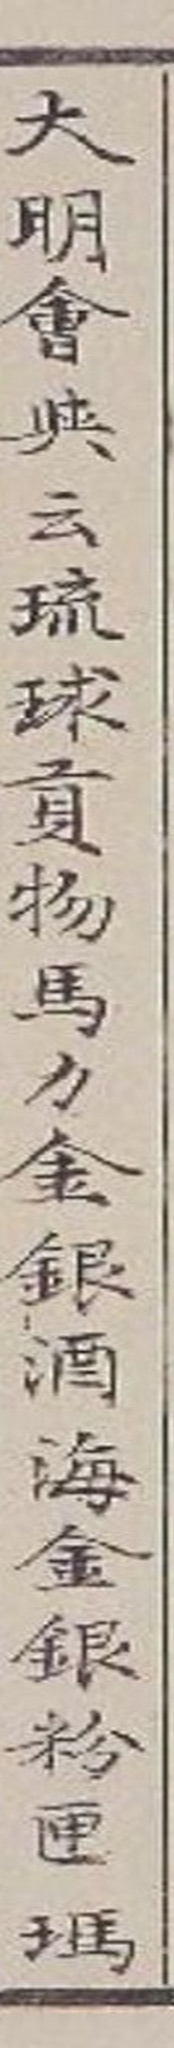大明会与云琉球貢物馬力金銀酒海金銀粉匣瑪
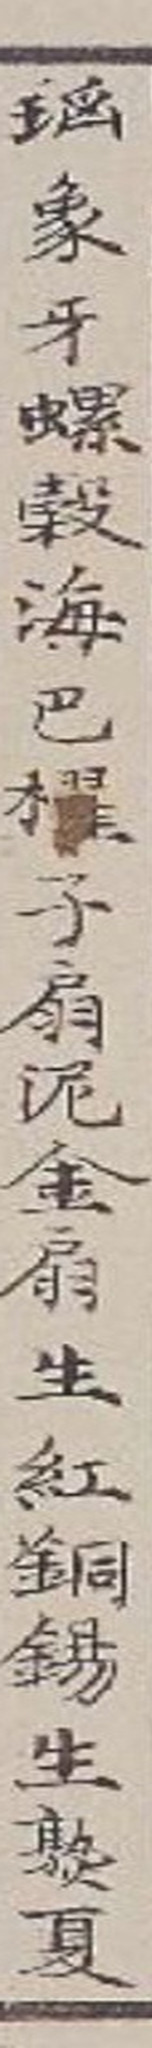瑙象牙螺殻海巴櫂子扇泥金扇生紅銅錫生熟夏
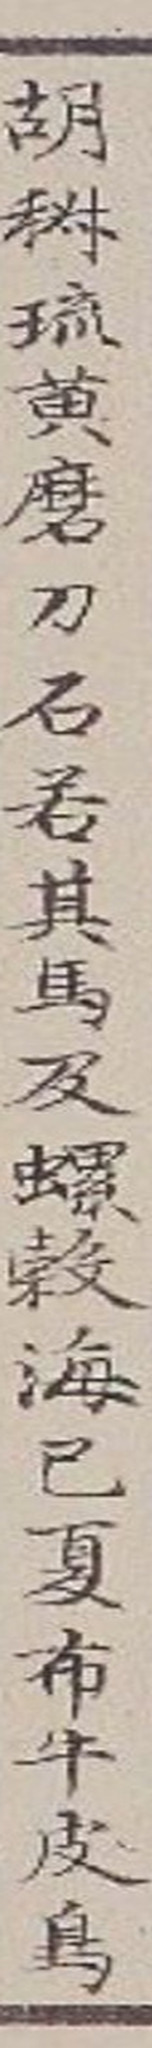胡琉黄磨刀石若其馬及螺殻海已夏布牛皮鳥
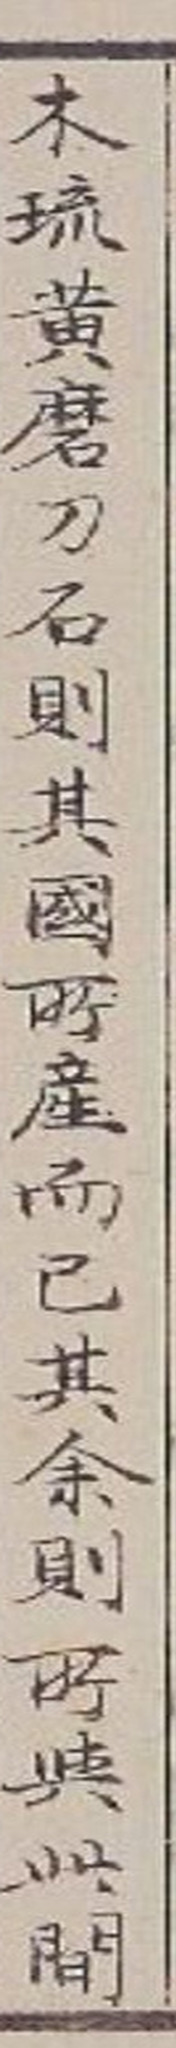木琉黃磨刀石則其国所産而已其余則所与此間
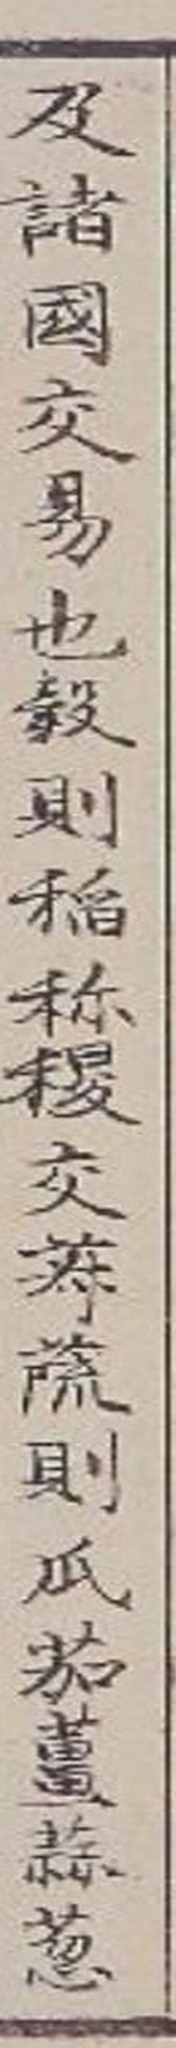及諸国交易也穀則稲称稷交蔬則瓜茄薑蒜葱
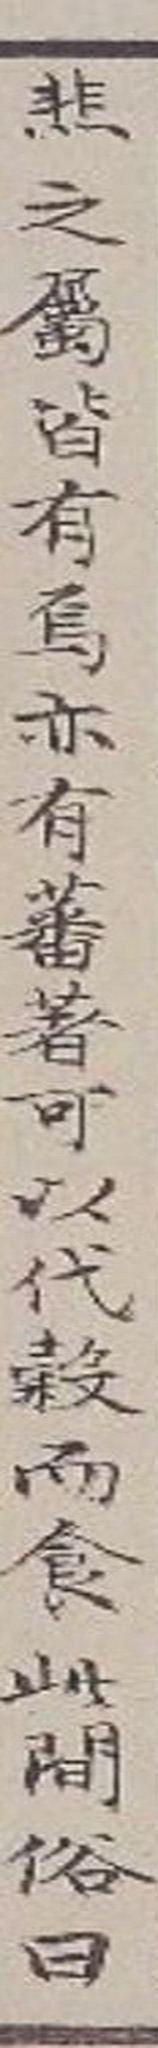悲之属皆有焉亦有蕃著可以代穀而食此間俗曰

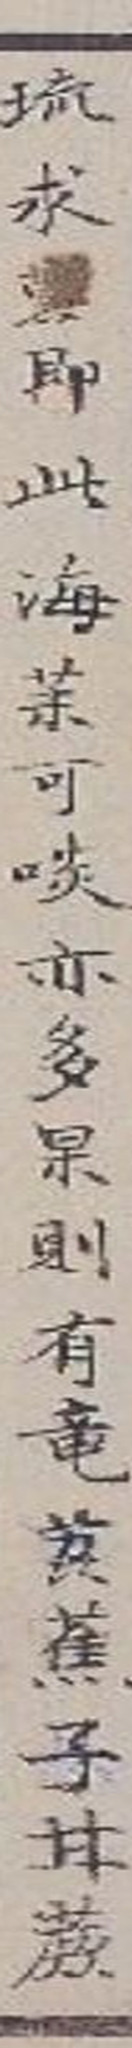琉求即此海茉可啖亦多杲則有竜茘蕉子甘蔗
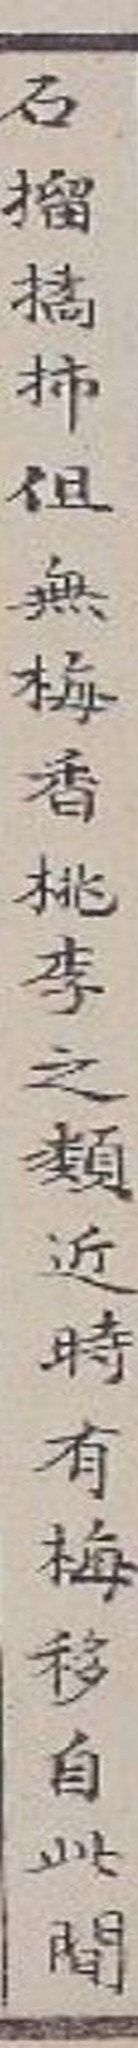石榴橘柿但無梅香桃李之類近時有梅移自此間
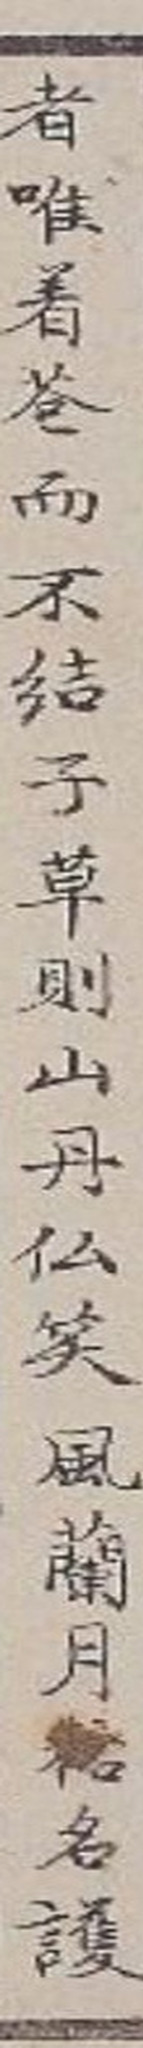者唯着花而不結子草則山丹仏笑風蘭月名護
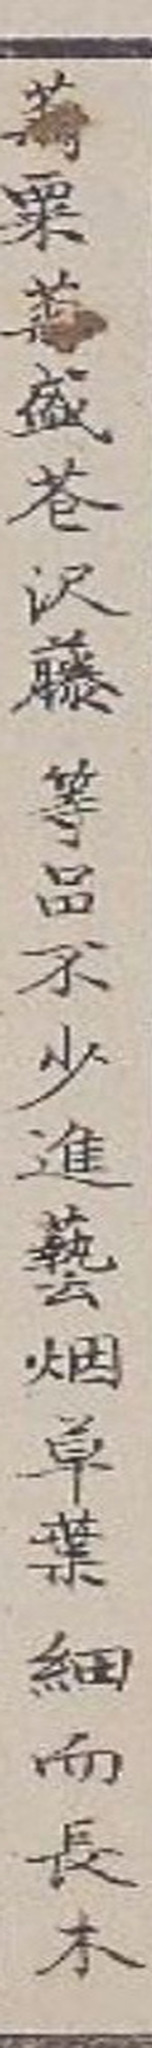栗盛花沢藤等品不少進芸煙草葉細而長木
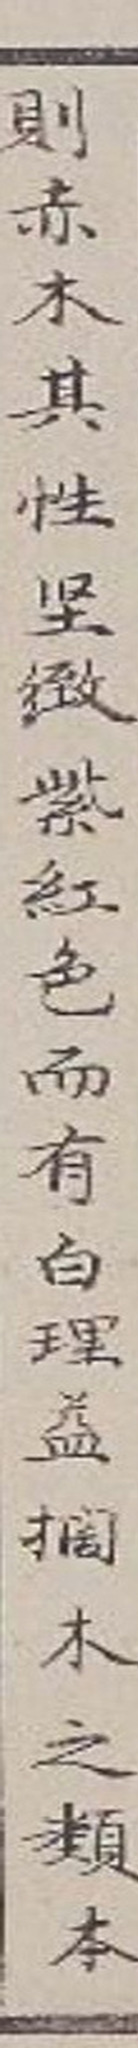則赤木其性竪緻紫紅色而有白理益木之類本
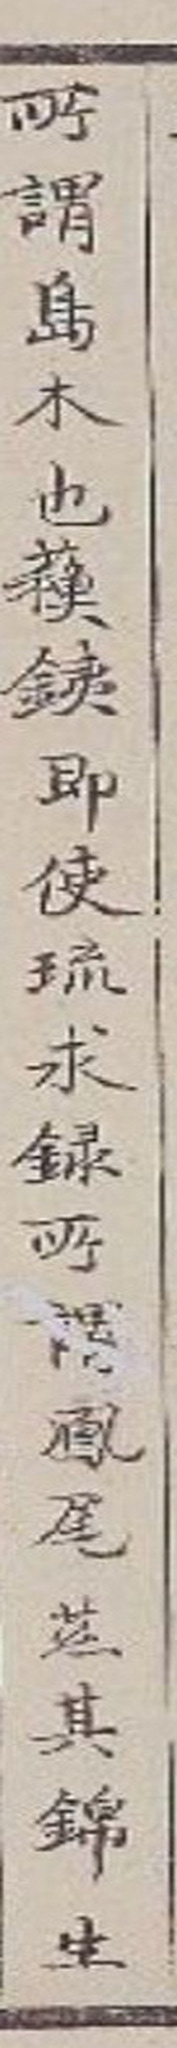所謂島木也蘇鉄即使琉求録所謂鳳尾蕉其野錦生
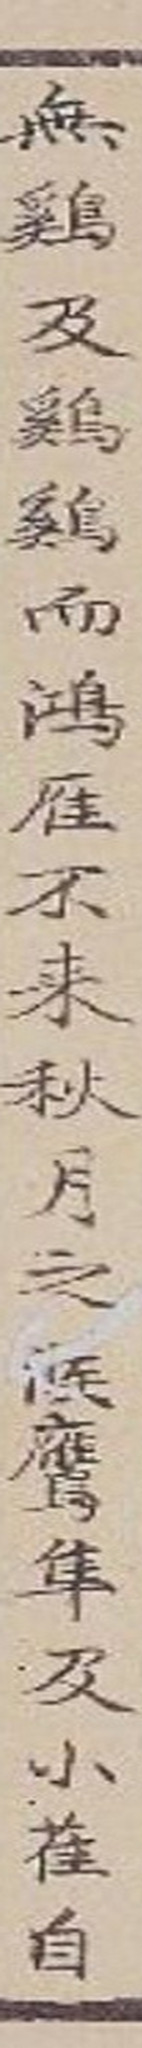無鶏及鶏鶏而鴻雁不来秋月之候鷹隼及小萑自
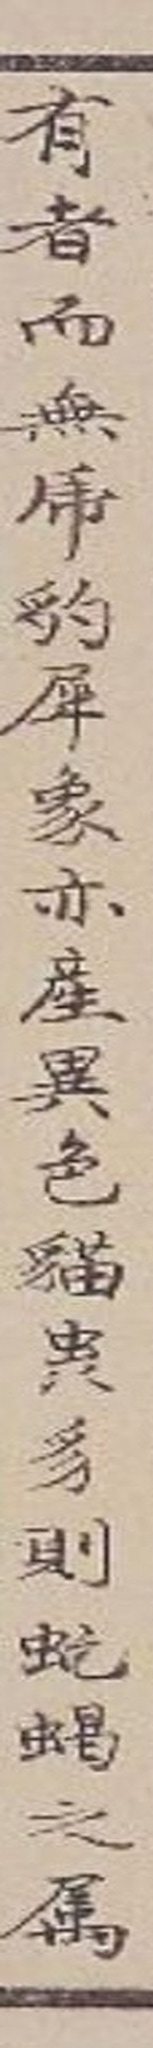有者而無虎豹犀象亦産異色豹猫虫豸則蛇蝎之属
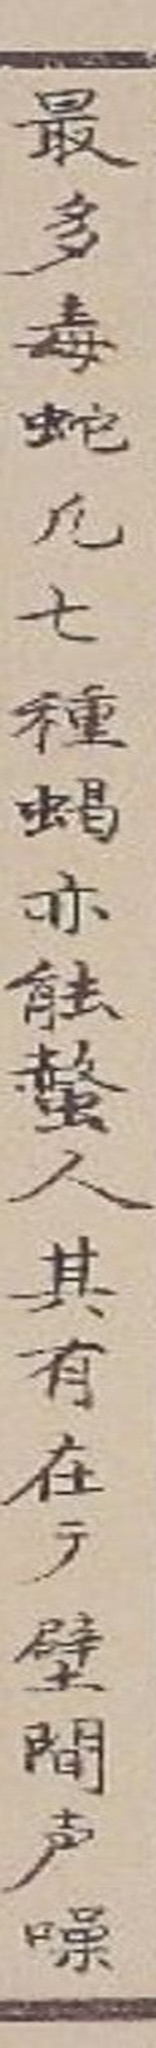最多毒蛇凡七種蝎亦能螫人其有在テ壁間声噪
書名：南島志 全
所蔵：University of the Ryukyus Library
